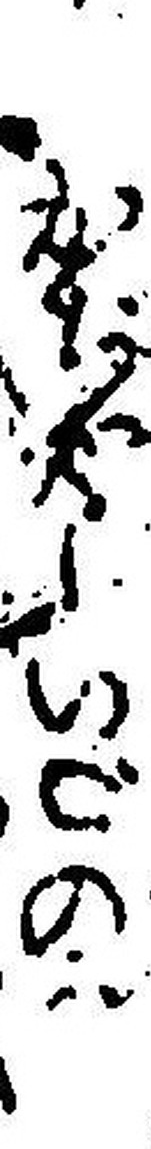かぢやふいごの
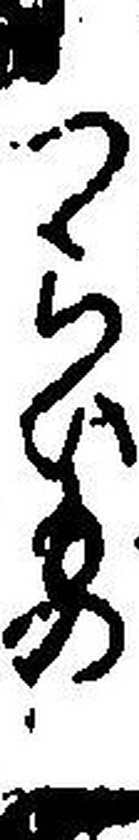つらいもの
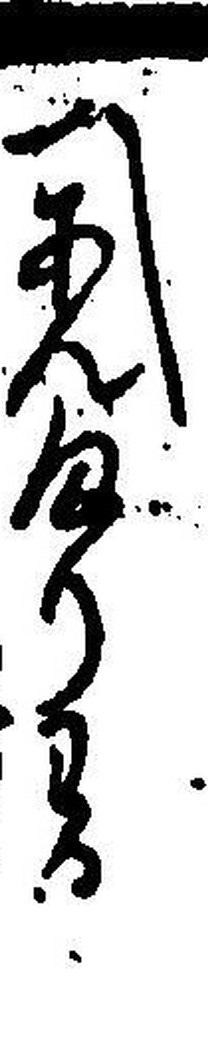〽あんまりわる
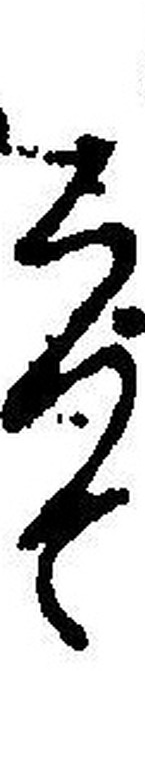くつて
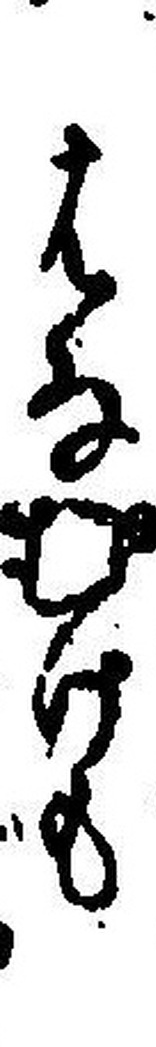はなむけも
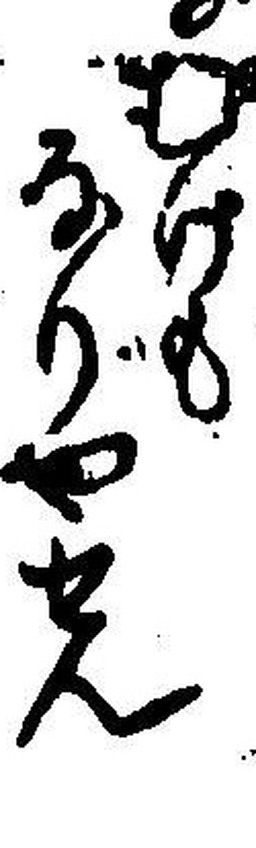なりやせん

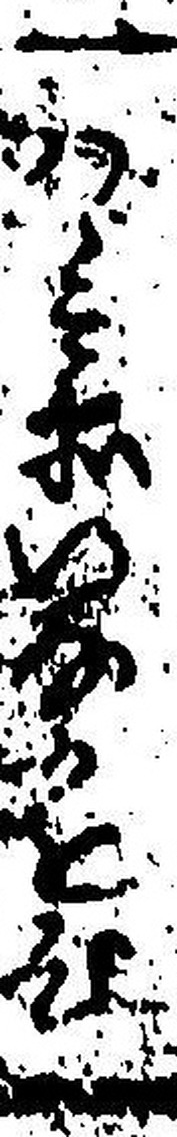八郎兵衛いなかをめ？
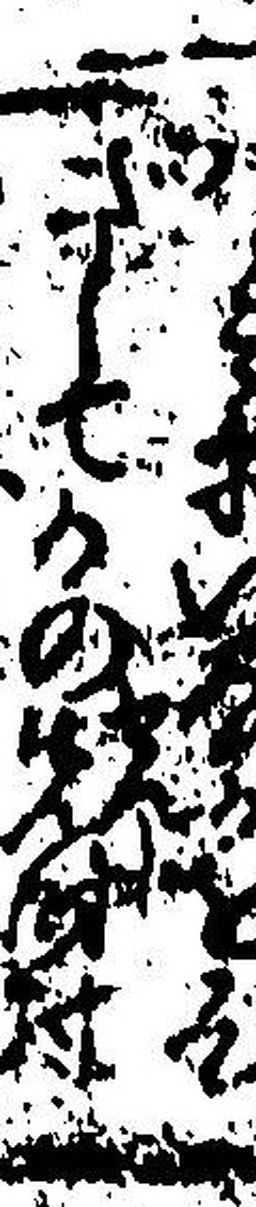ざしてかの先時村
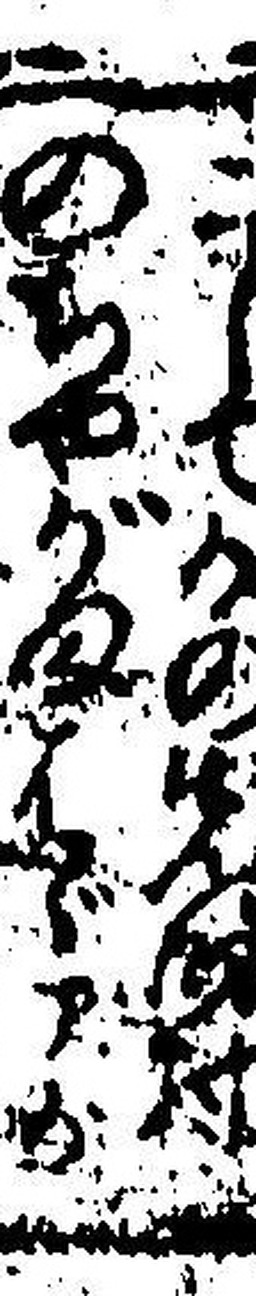のちやがまはゞァの
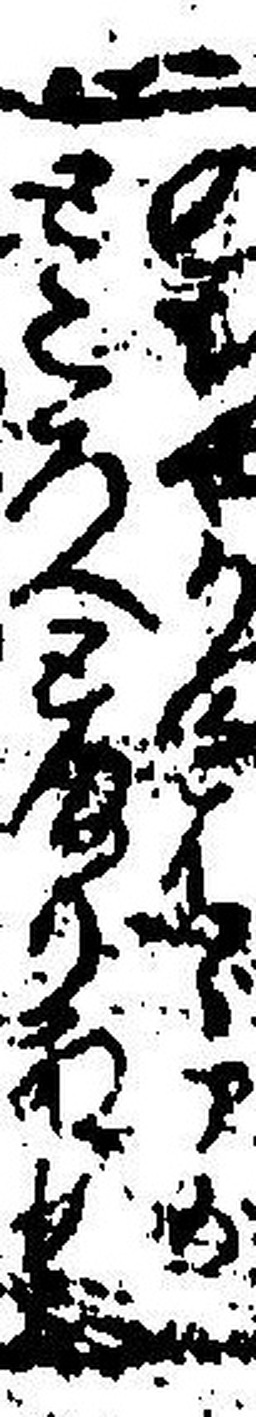ところへとまりあかし
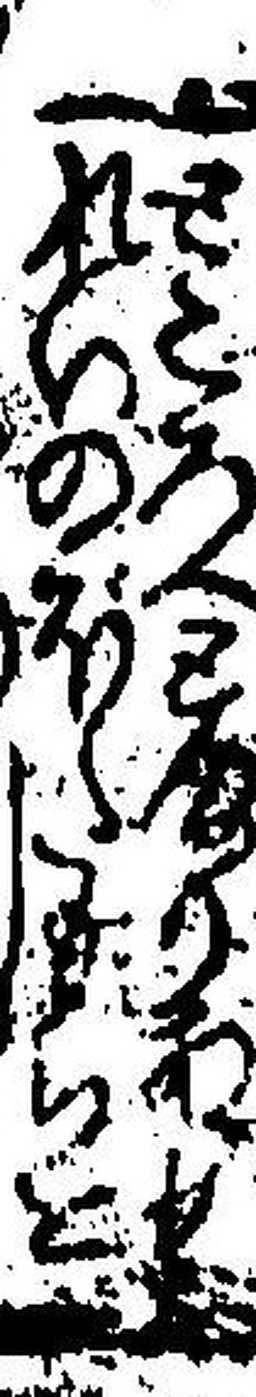れいのぼたもちを
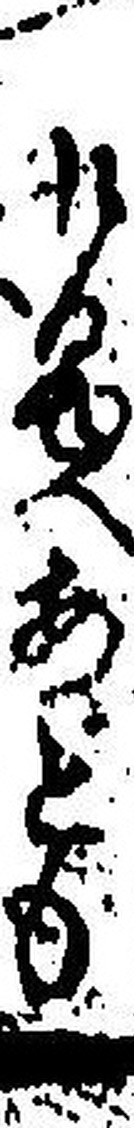けるゆへあとも
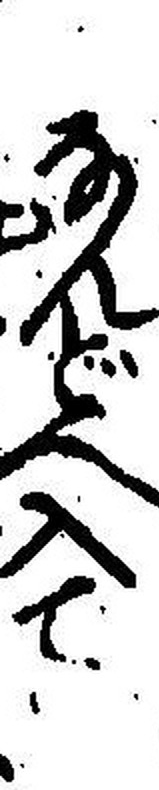なんどへ入て
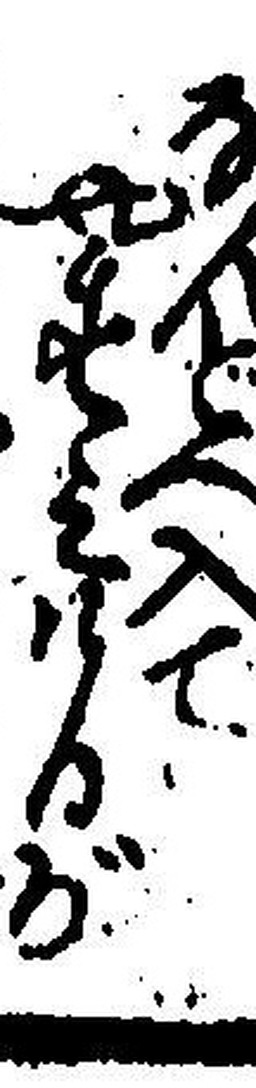やすみけるが
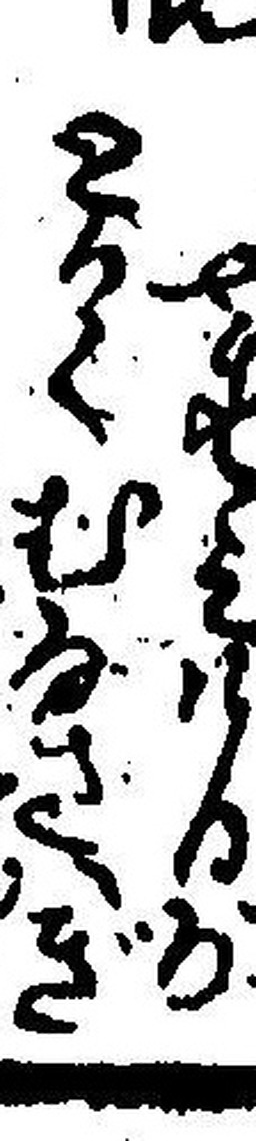とかくむなさはき
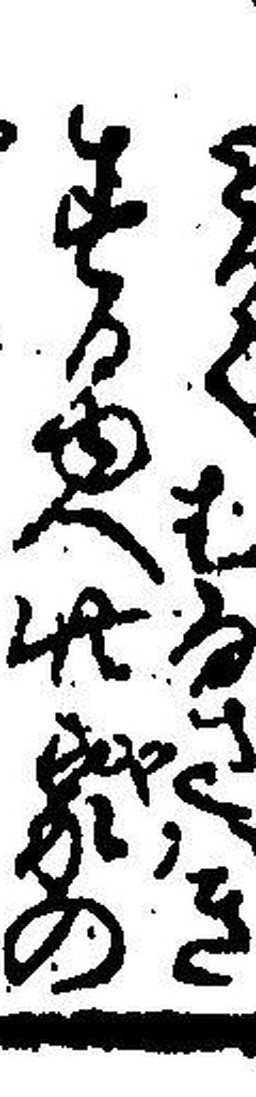するゆへ此家の
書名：花芳野犬斑 / 山東京伝作
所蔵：東京大学総合図書館 General Library in the University of Tokyo, JAPAN
